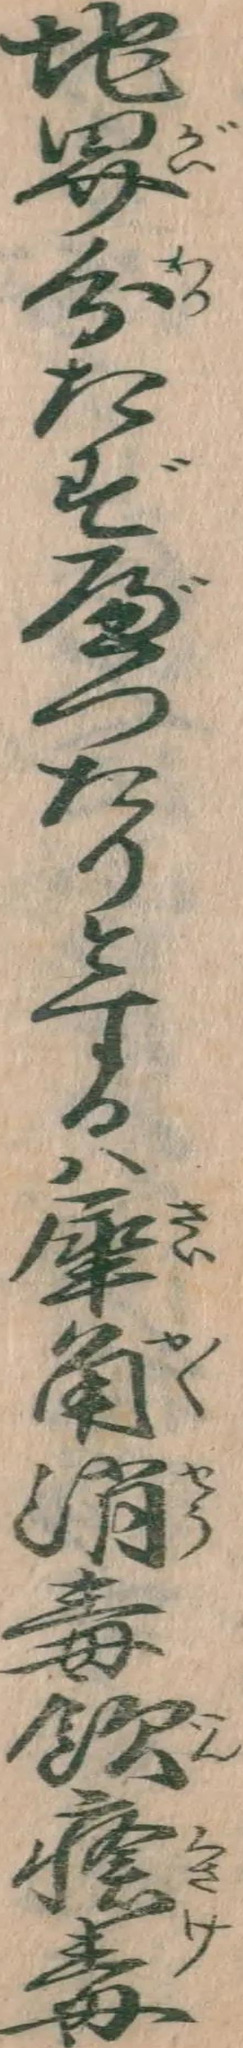地界分たずべつたりとするは犀角消毒飲瘡毒
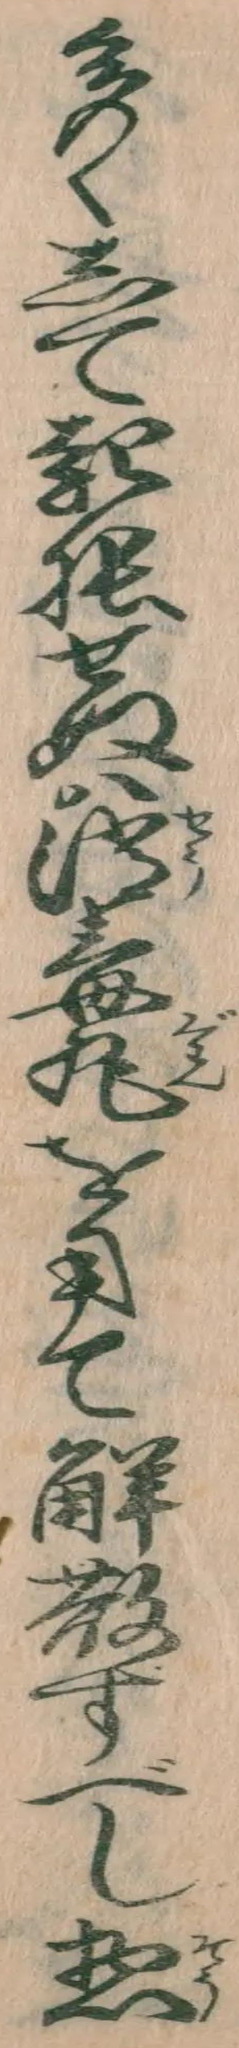多くして起脹せぬは散は消毒丸を用て解散すべし惣
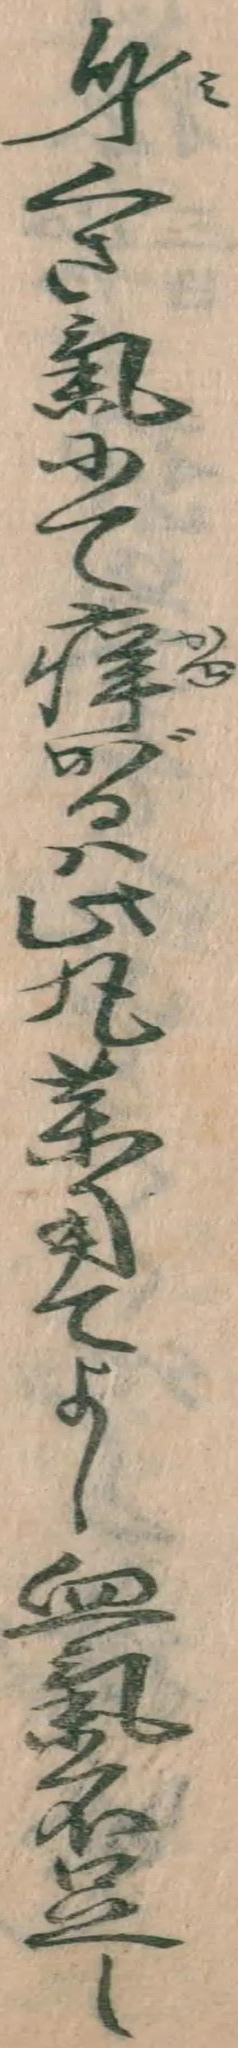身くさ気にて痒がるは此丸薬用てよし血気不足し
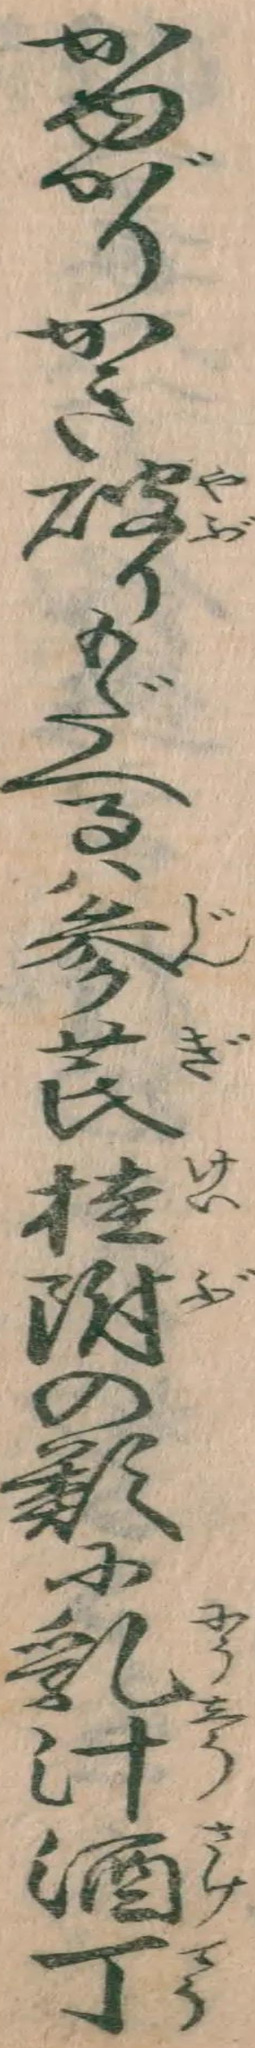かゆがりかき破りもだへるは参芪桂附の類に乳汁酒丁
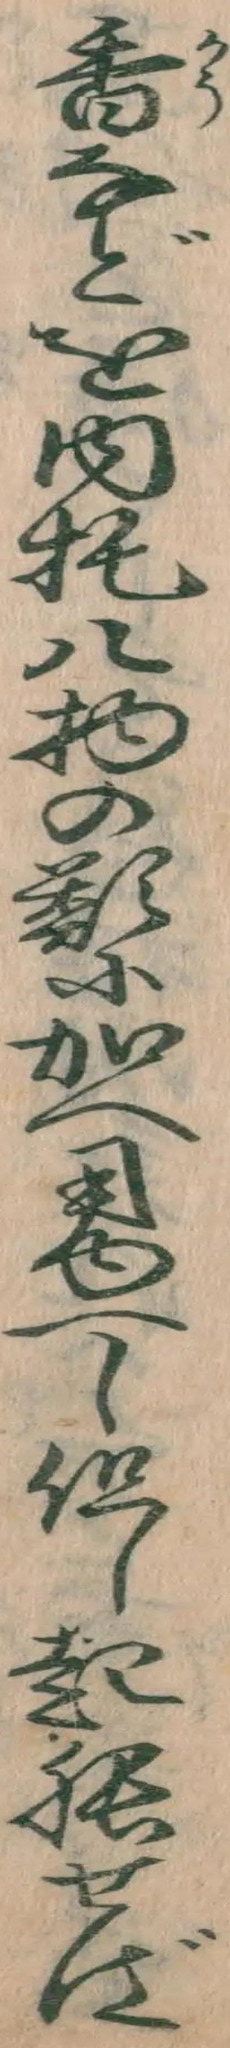香などを内托八物の類に加へ用ゆへし但し起脹せば

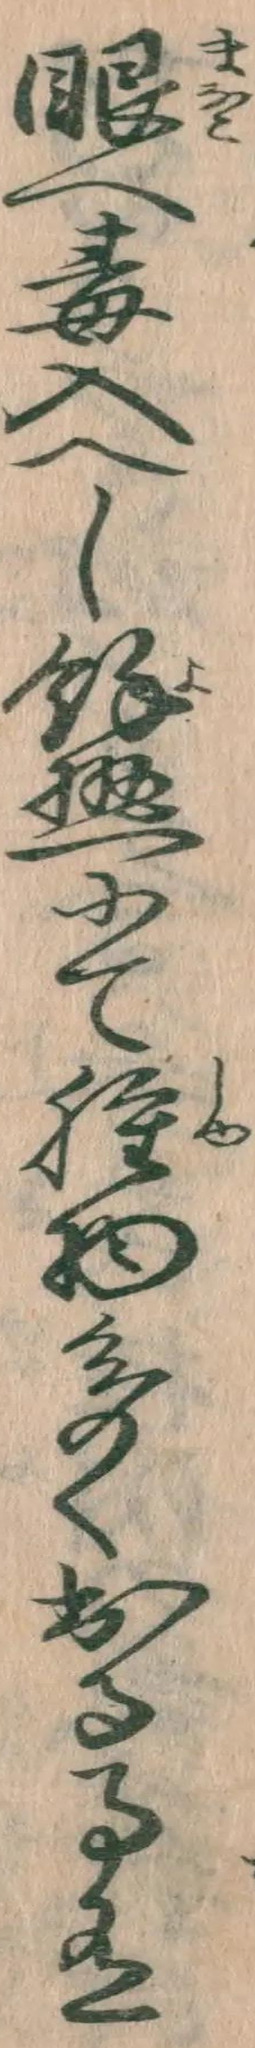眼へ毒入へし余熱にて腫物多く出る事有
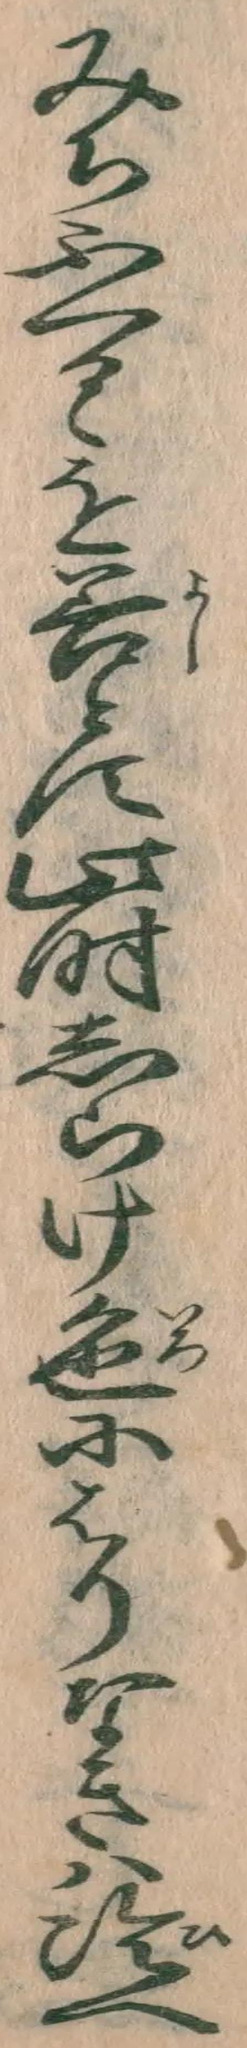みちふくるゝを善とす此時しらけ色にはりなきは冷へ
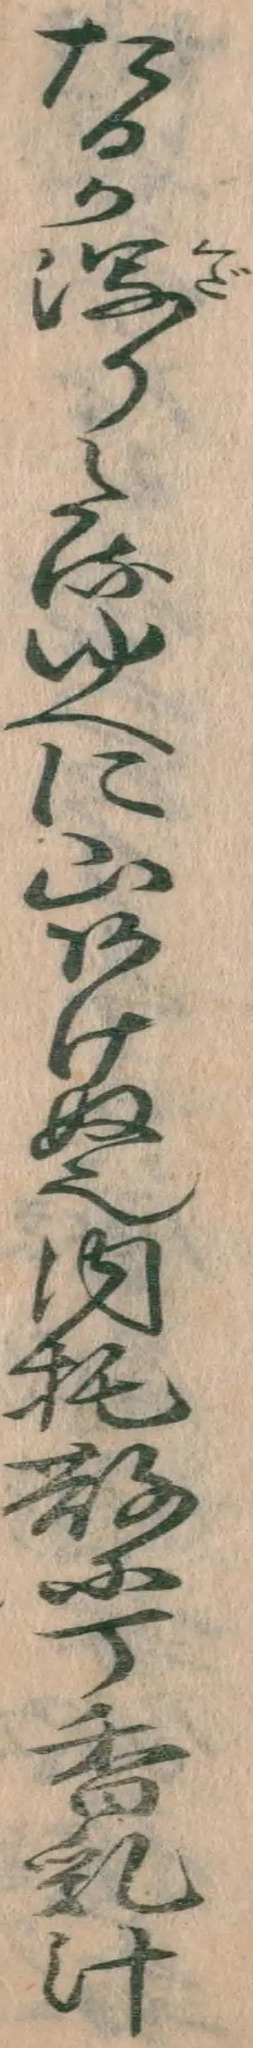たるか瀉りたるゆへに山あけぬ也内托散に丁香乳汁
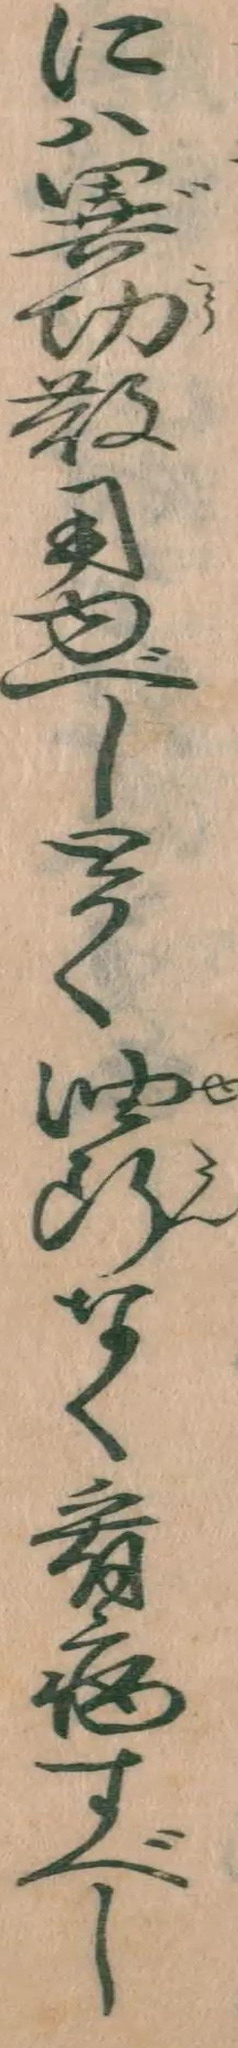には異功散用ゆべしとかく油断なく看病すべし
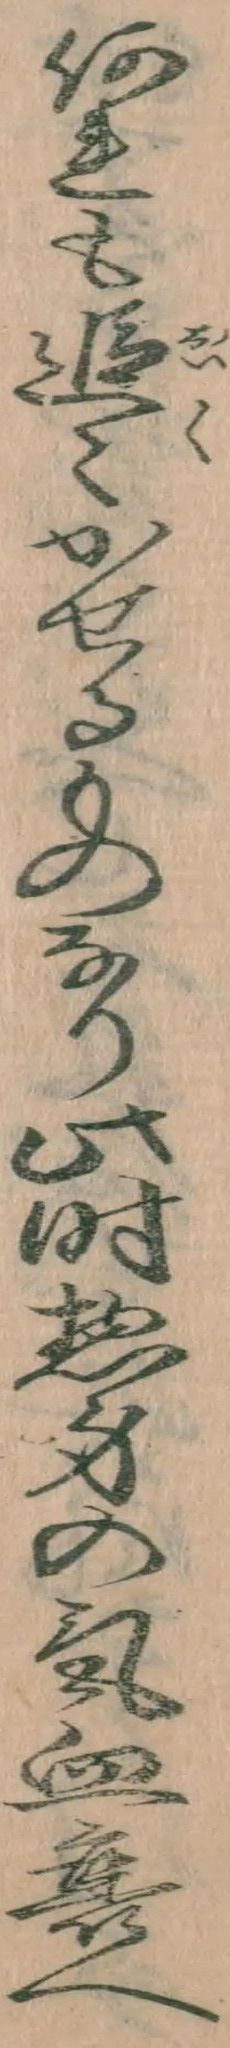何れも追々かせるものなり此時惣身の気血衰へ
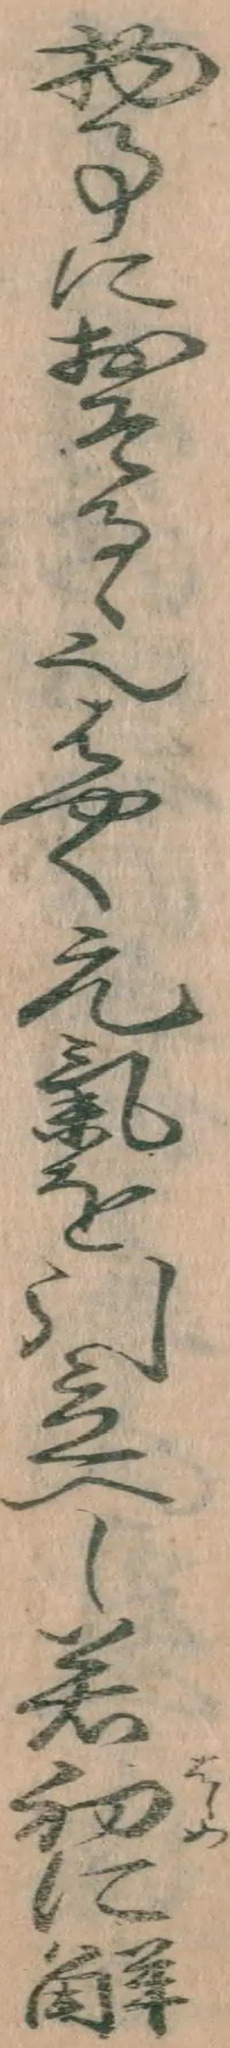物事におそるゝ也はやく元気を引立へし若初に解
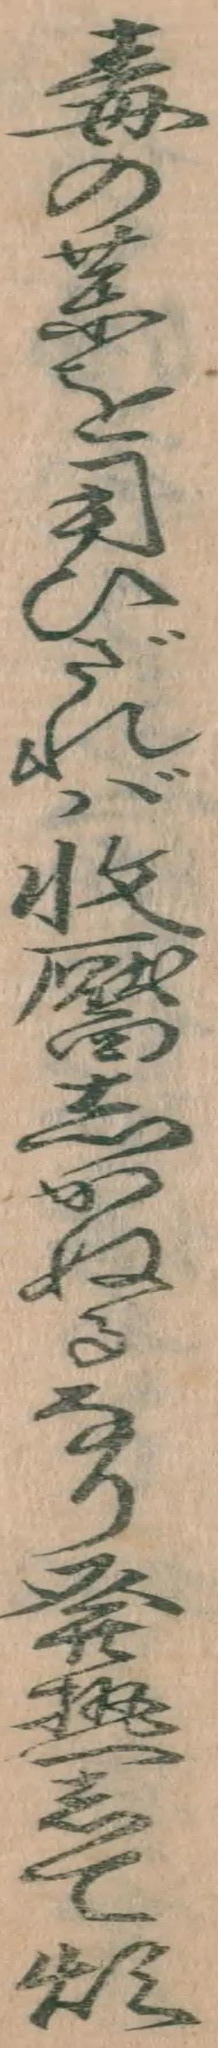毒の薬を用ひざれば収靨しかぬるなり発熱して煩
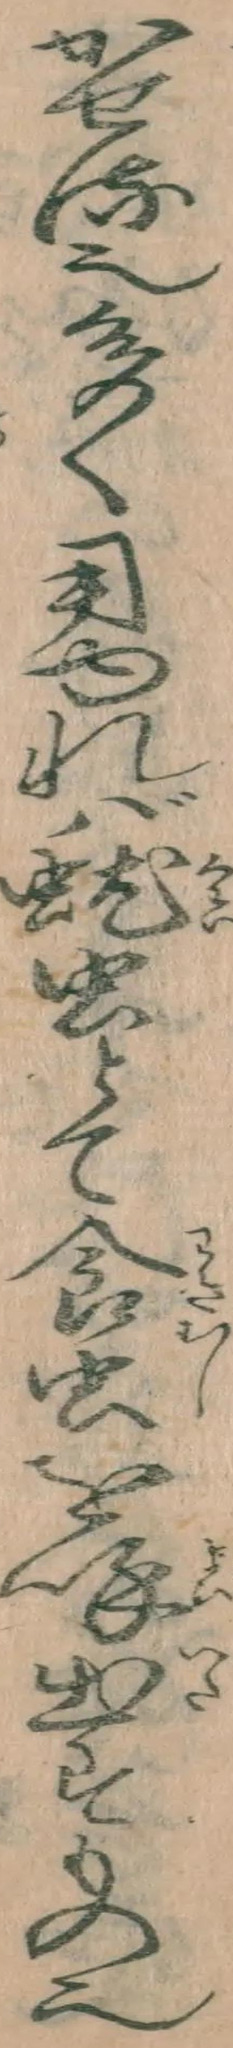かせる也多く用ゆれば蚘虫とて食虫を呼出すもの也
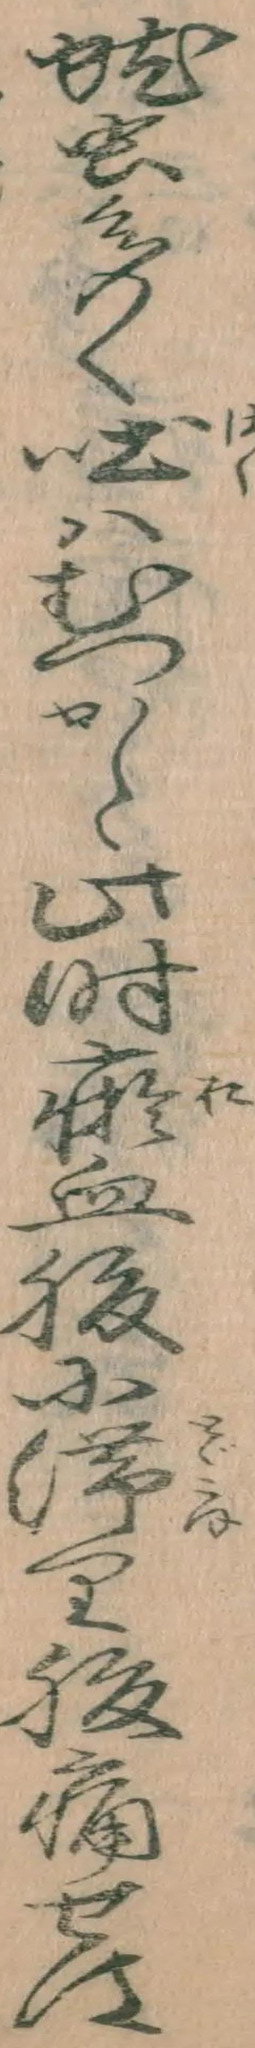蚘虫多く吐はむつかしく此時瘀血腹に滞り腹痛せは
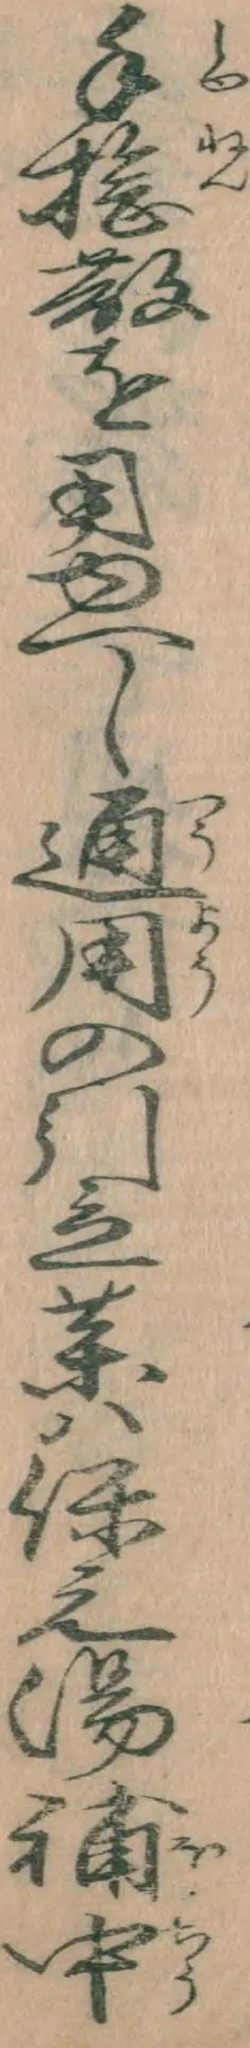手捻散を用ゆへし通用の引立薬は保元湯補中

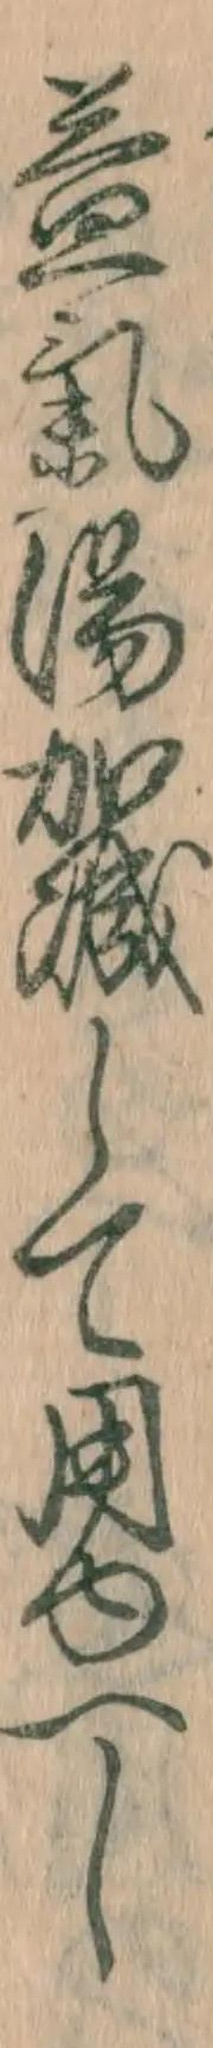益気湯加減して用ゆへし
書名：痘家初心問答
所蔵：国立国会図書館 National Diet Library, JAPAN
